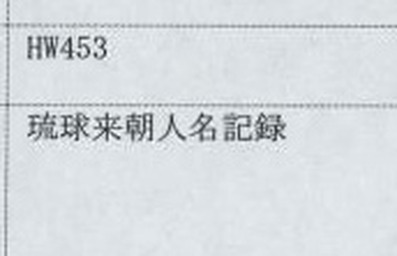琉球来朝人名記録
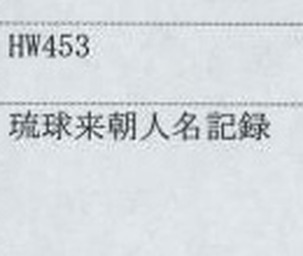琉球来朝人名記録
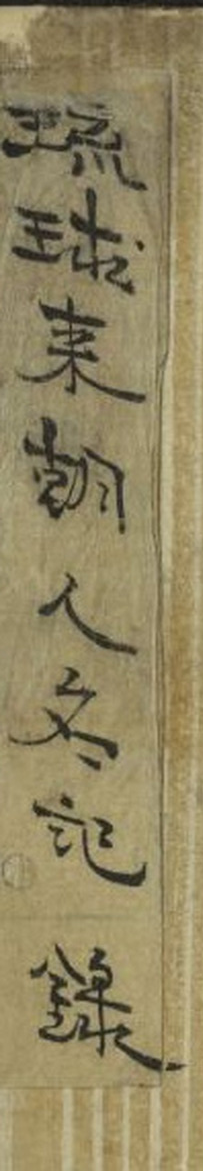琉球来朝人名記録

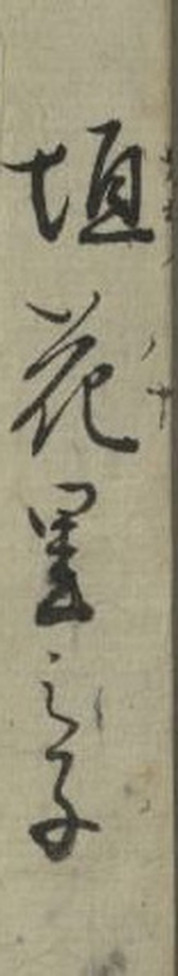埴花里之子
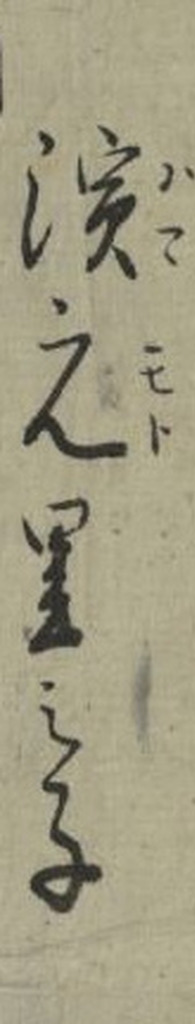濱元里之子
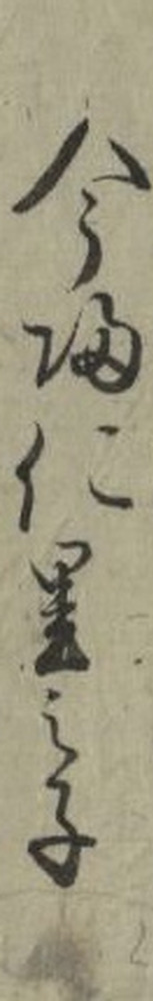今帰仁里之子
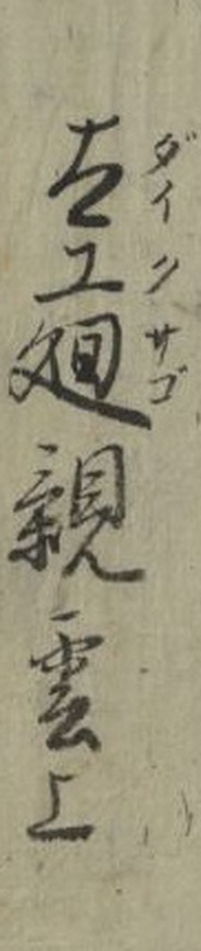太工廻親雲上
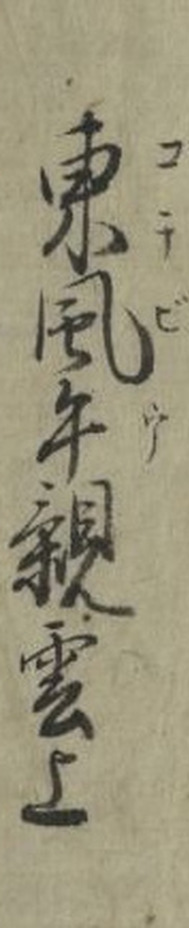東風午親雲上
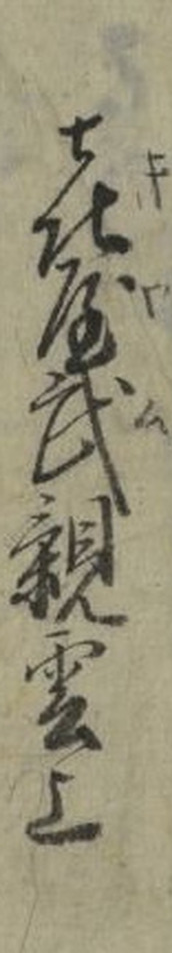喜屋武親雲上
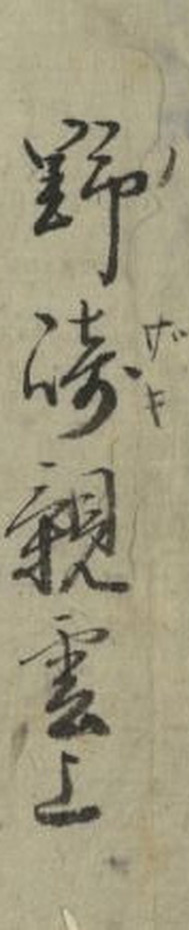野崎親雲上
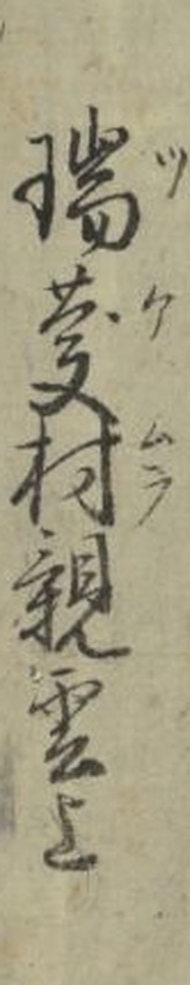瑞慶村親雲上
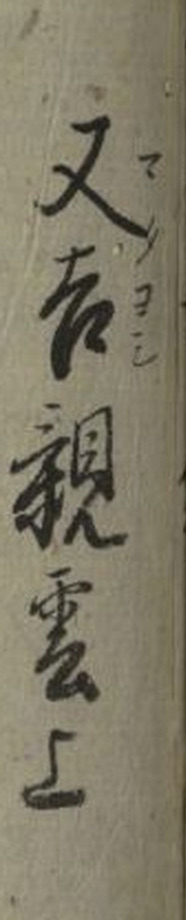又吉親雲上
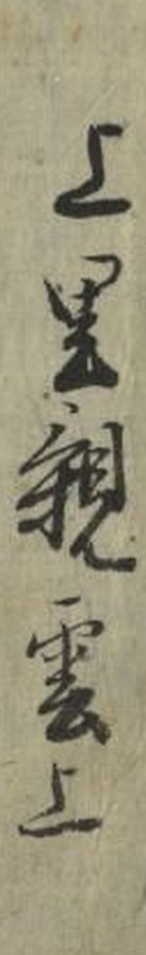上里親雲上
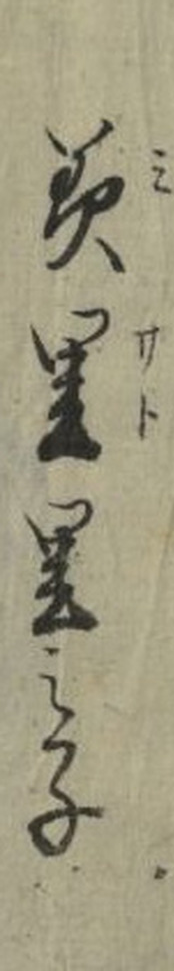美里里之子
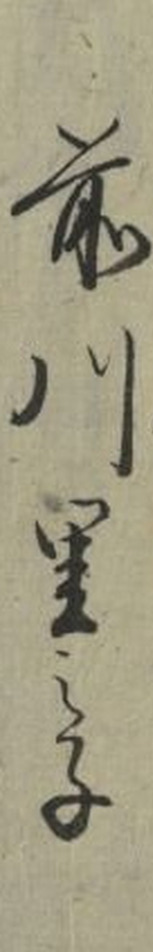前川里之子
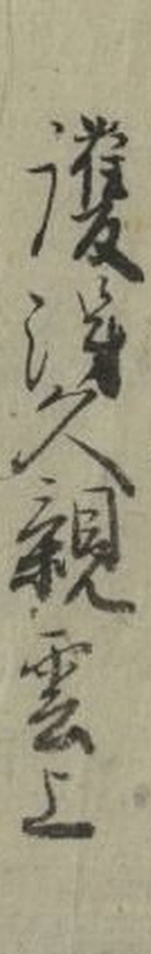護得久親雲上
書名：琉球来朝人名記録
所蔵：University of the Ryukyus Library
